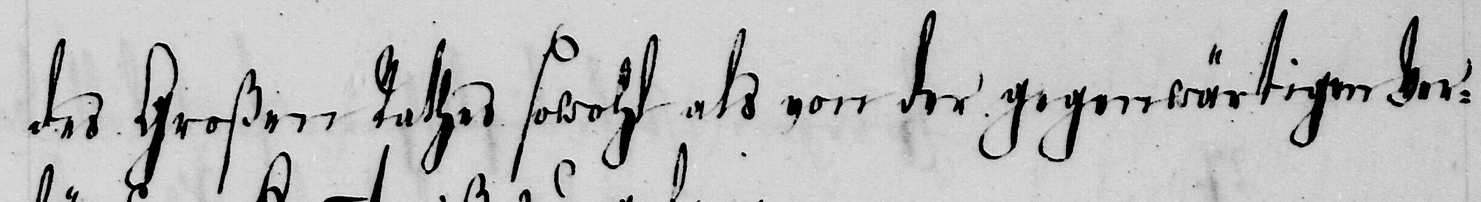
des Großen Rathes sowohl als von der gegenwärtigen Ver¬
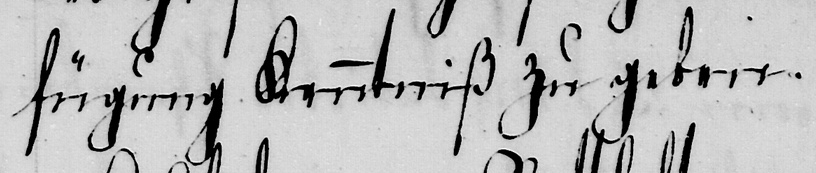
fügung Kenntniß zu geben.
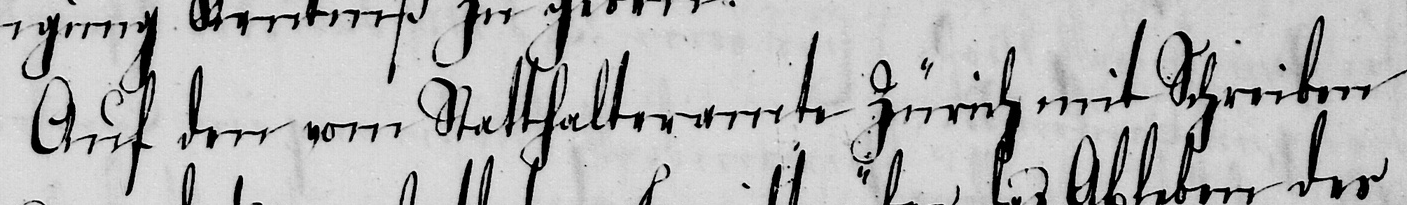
Auf den vom Statthalteramte Zürich mit Schreiben
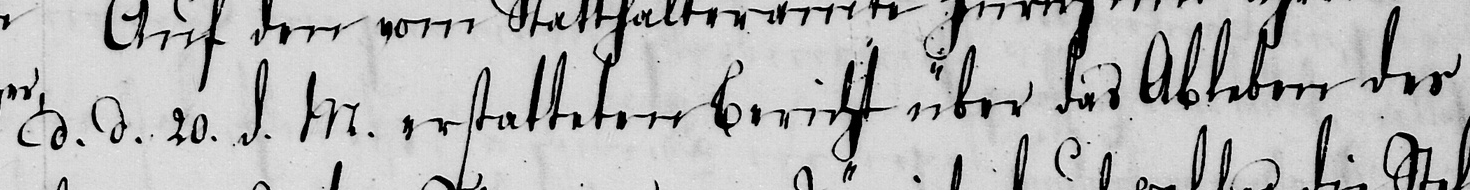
d. d. 20. d. M. erstatteten Bericht über das Ableben des
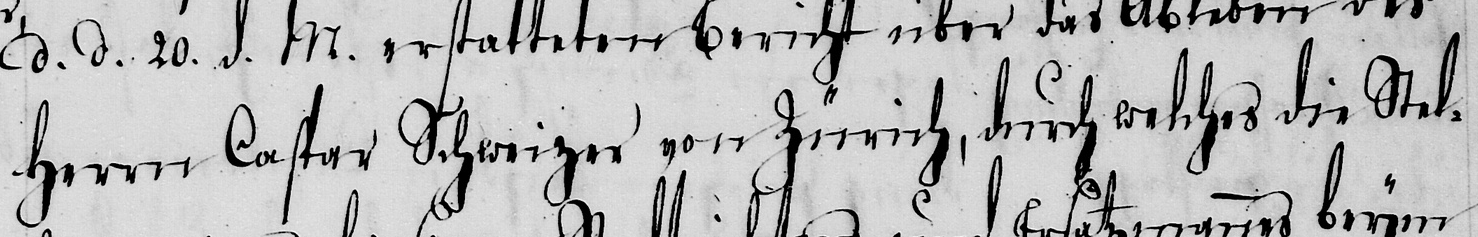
Herrn Caspar Schweizer von Zürich, durch welches die Stel¬
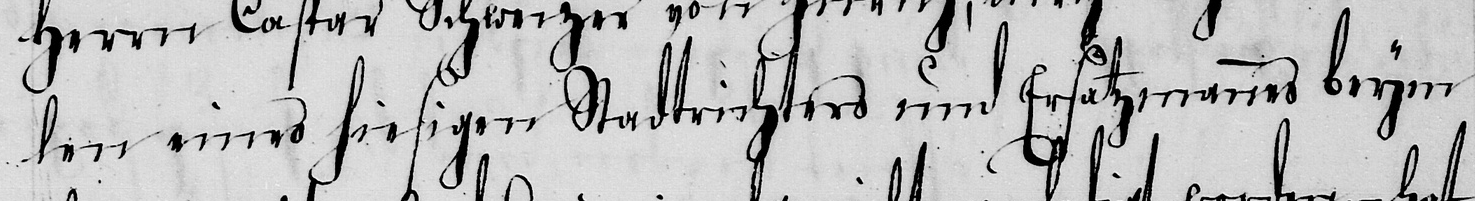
len eines hiesigen Stadtrichters und Ersatzmannes beym
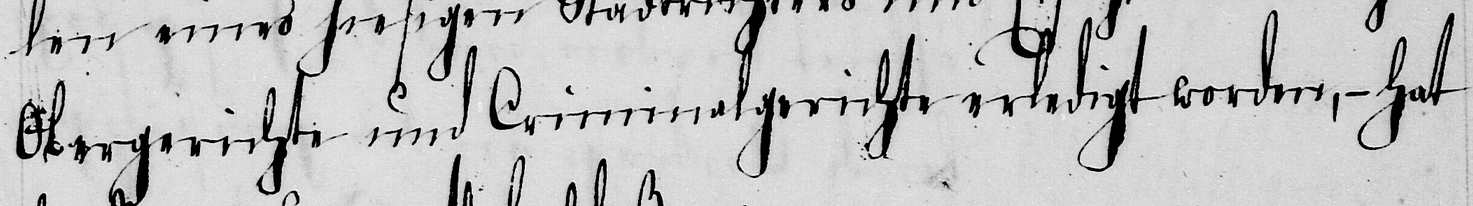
Obergerichte und Criminalgerichte erledigt worden, – hat
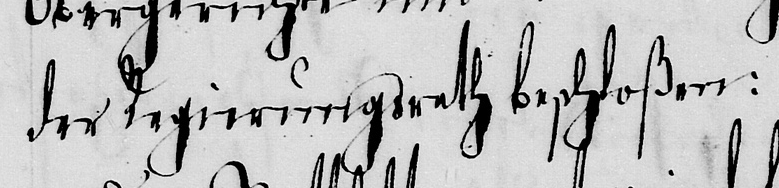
der Regierungsrath beschloßen:
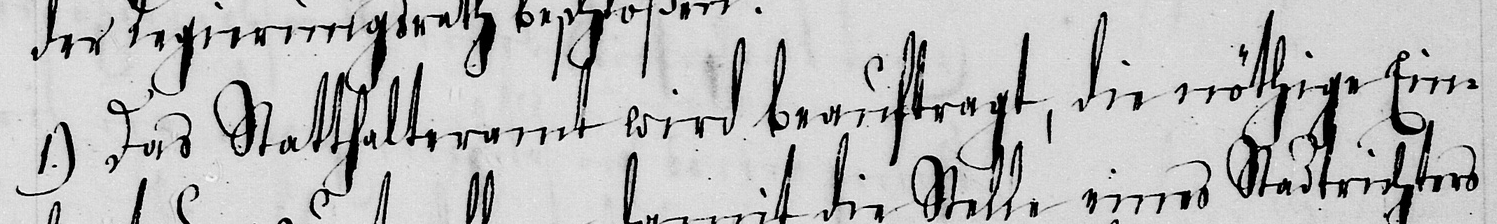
1.) Das Statthalteramt wird beauftragt, die nöthige Ein¬
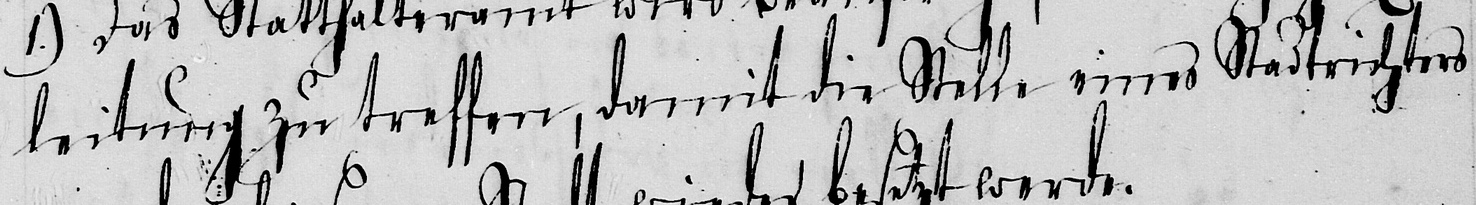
leitung zu treffen, damit die Stelle eines Stadtrichters
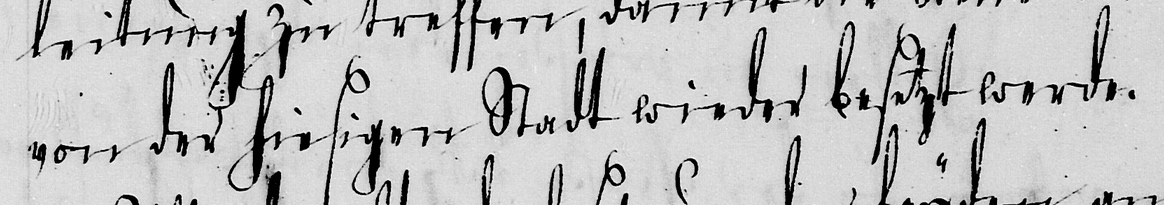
von der hiesigen Stadt wieder besetzt werde.
